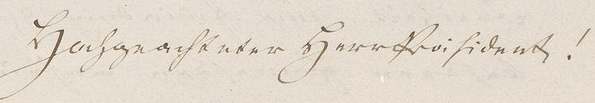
Hochgeachteter Herr Präsident!
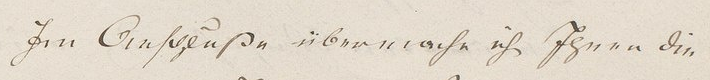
Im Anschluße übermache ich Ihnen die
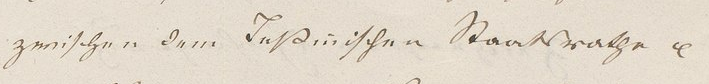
zwischen dem Teßinischen Staatsrathe &
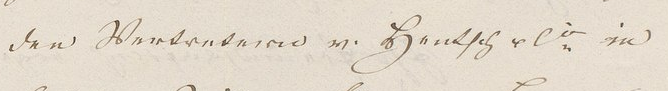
den Vertretern v. Hentsch & Co in
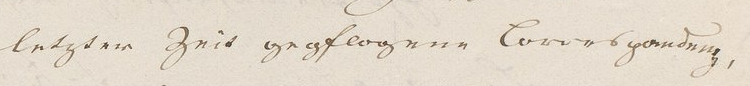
letzter Zeit gepflogene Correspondenz,
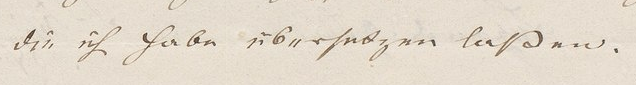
die ich habe übersetzen laßen.
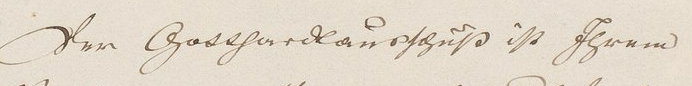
Den Gotthardtausschuß ist Ihrem
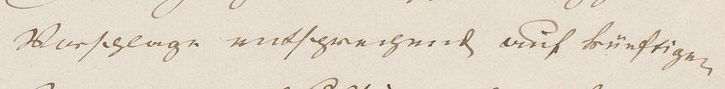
Vorschlage entsprechend auf künftigen
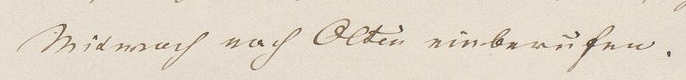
Mitwoch nach Olten einberufen.
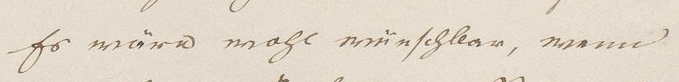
Es wäre wohl wünschbar, wenn
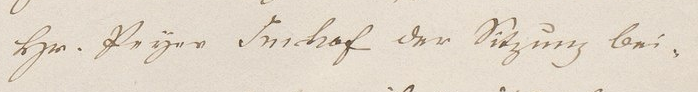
Hr. Peyer Imhof der Sitzung bei-
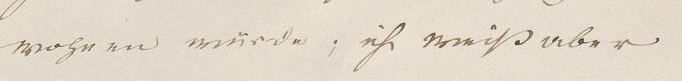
wohnen würde; ich weiß aber
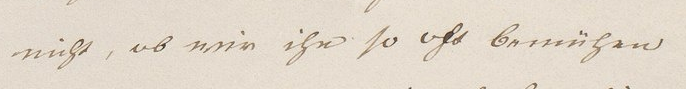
nicht, ob wir ihn so oft bemühen
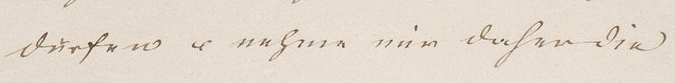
dürfen & nehme mir daher die
